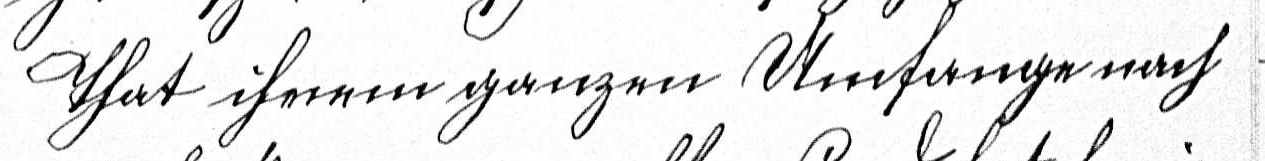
That ihrem ganzen Umfange nach
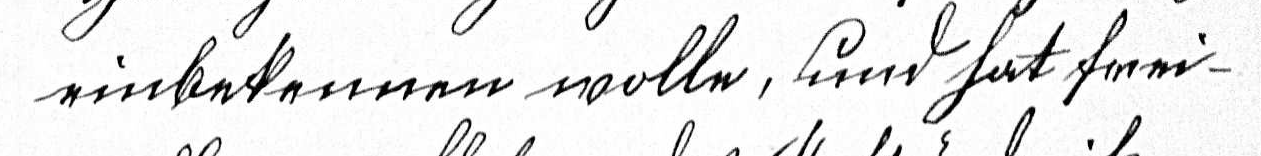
einbekennen wolle, und hat frei¬
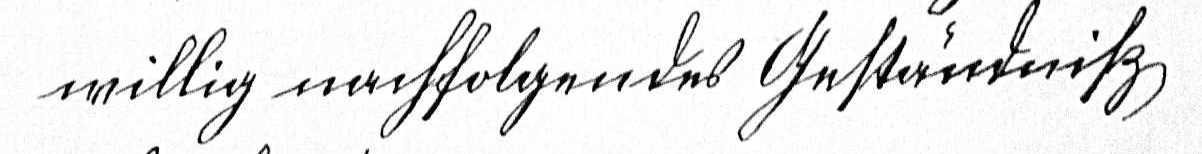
willig nachfolgendes Geständniß
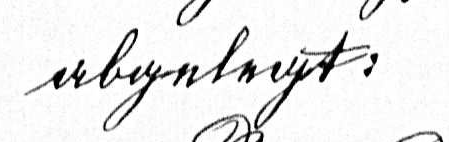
abgelegt:
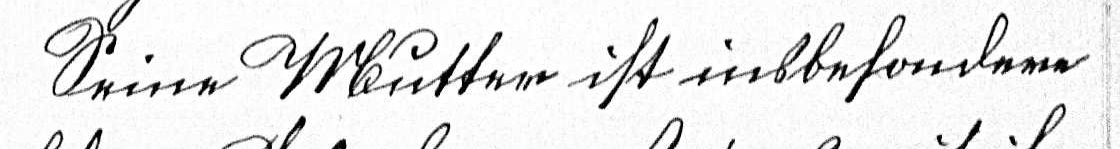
Seine Mutter ist insbesondere
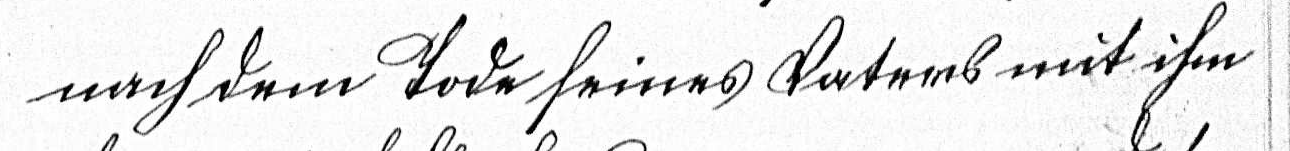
nach dem Tode seines Vaters mit ihm
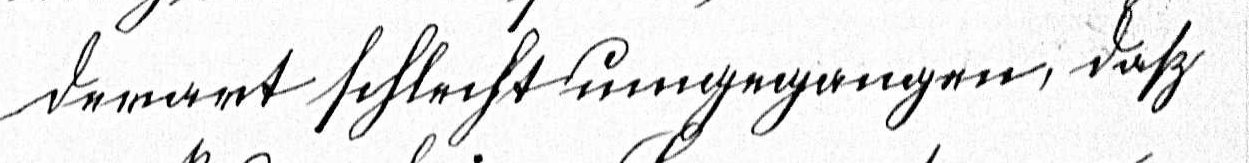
derart schlecht umgegangen, daß
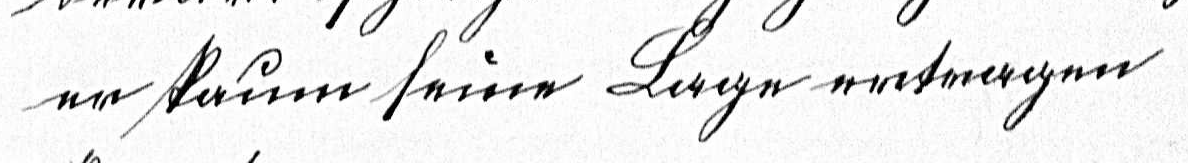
er kaum seine Lage ertragen
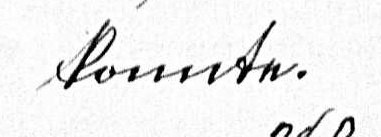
konnte.
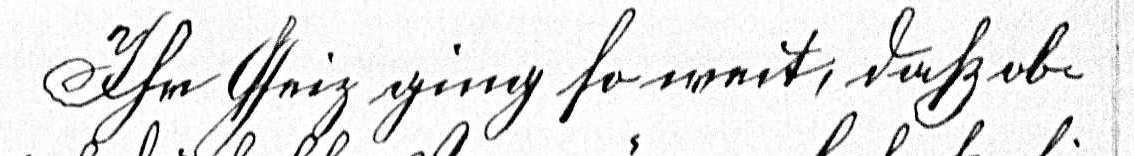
Ihr Geiz ging so weit, daß ob¬
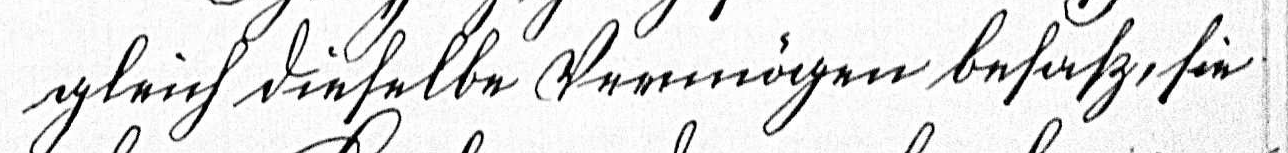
gleich dieselbe Vermögen besaß, sie
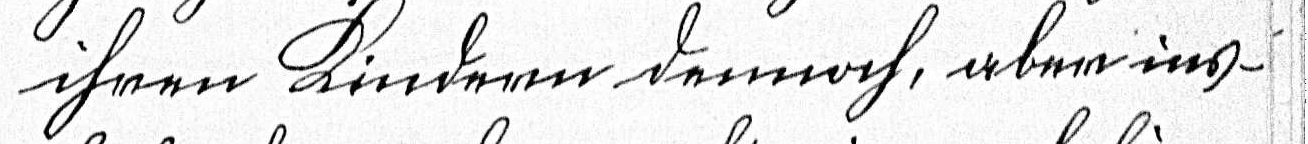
ihren Kindern dennoch, aber ins¬
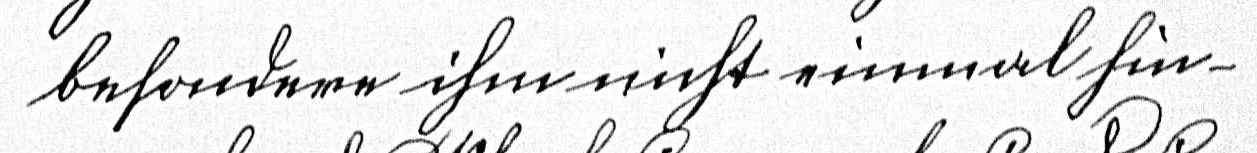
besondere ihn nicht einmal hin¬
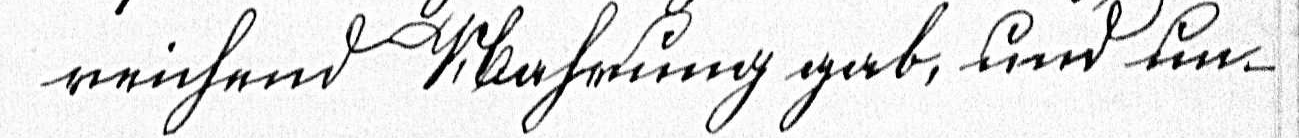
reichend Nahrung gab, und un¬
